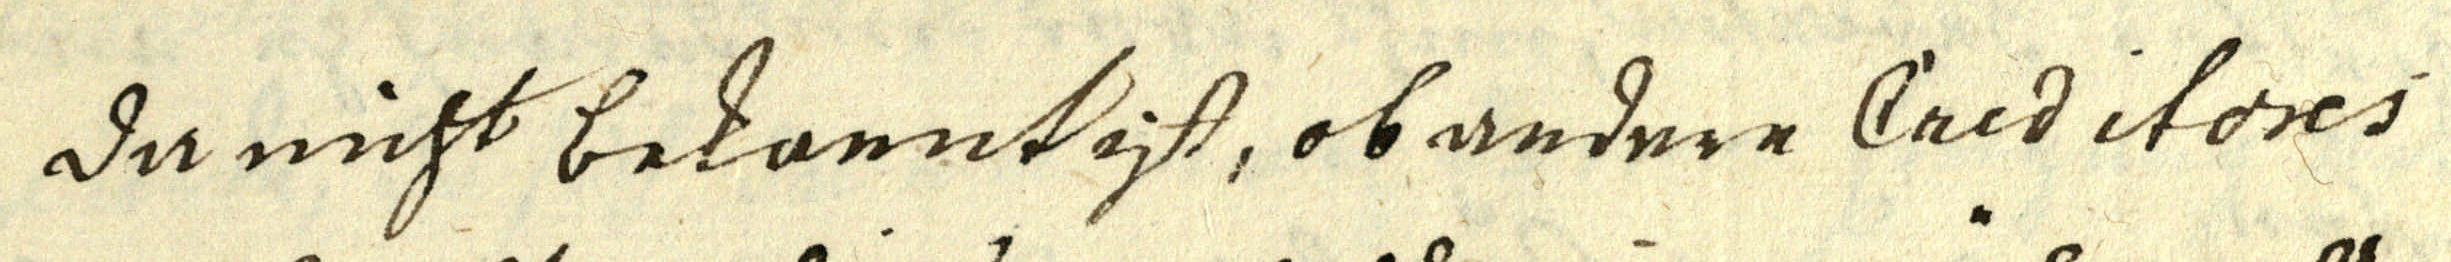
Da nicht bekannt ist, ob andere Creditores
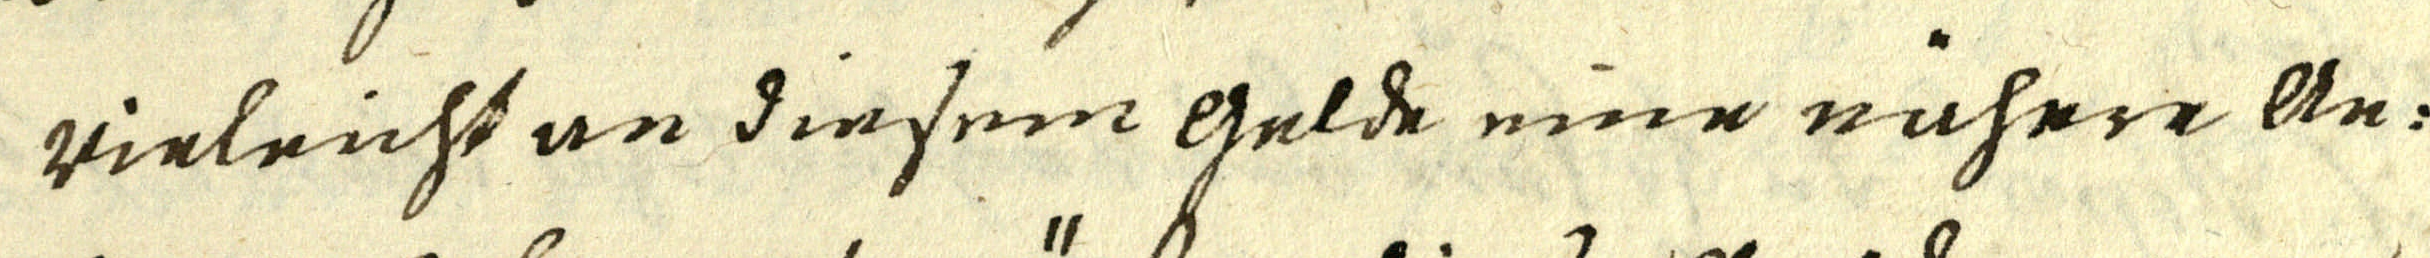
vieleicht an diesem Gelde eine nähere An¬
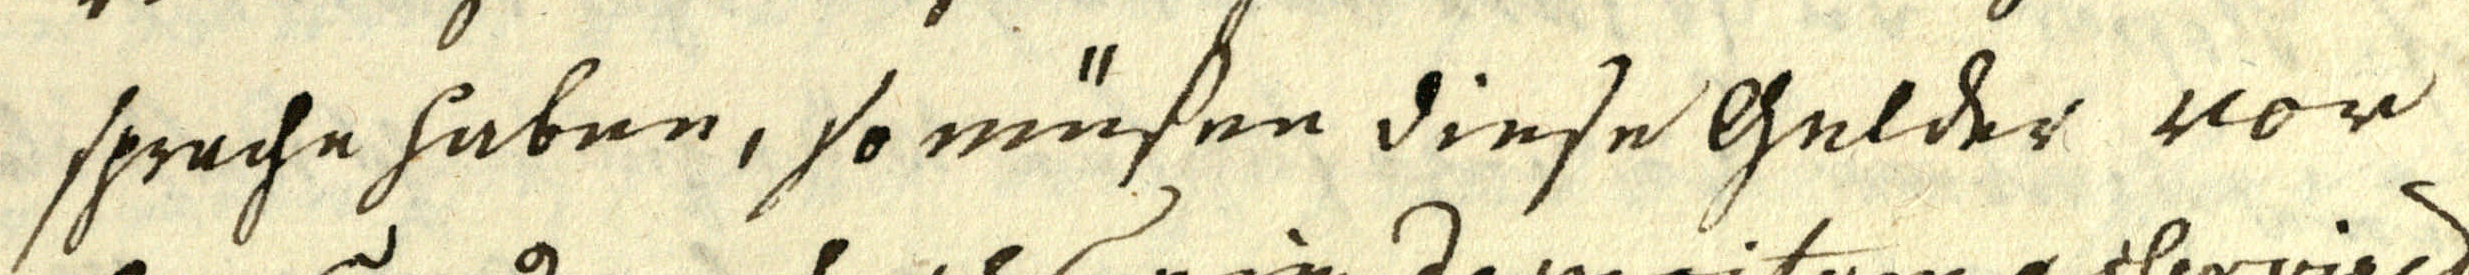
sprache haben, so müßen diese Gelder vor
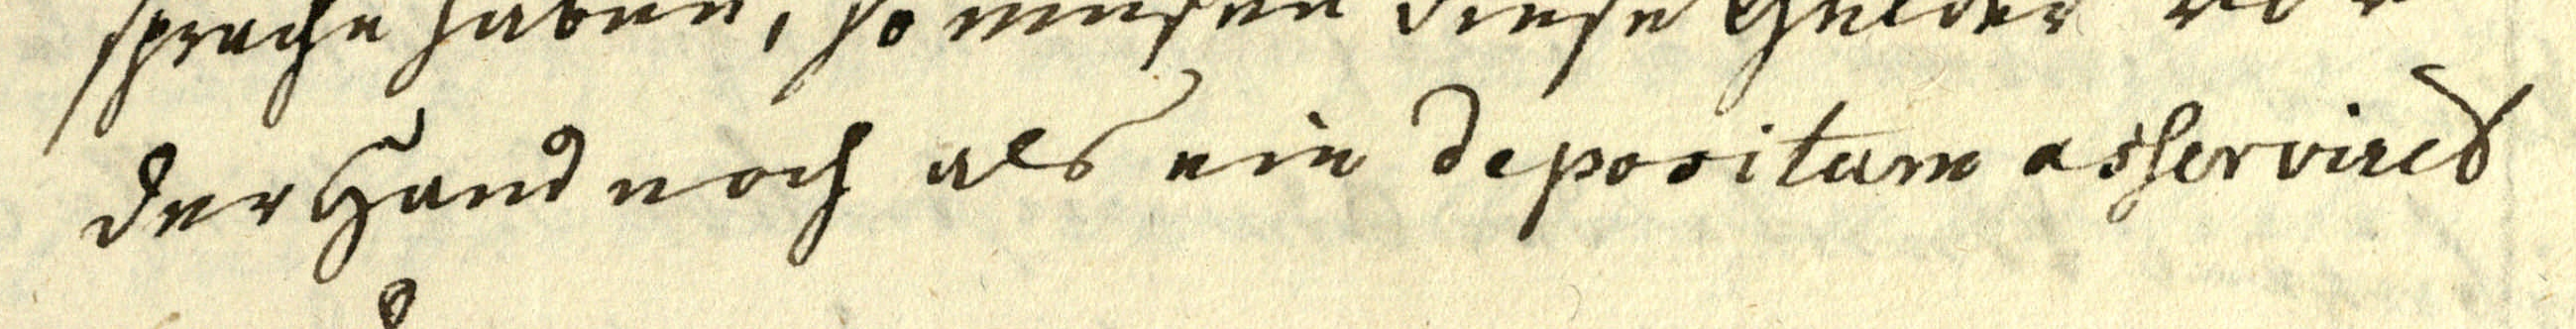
der Hand noch als ein depositum asserviret
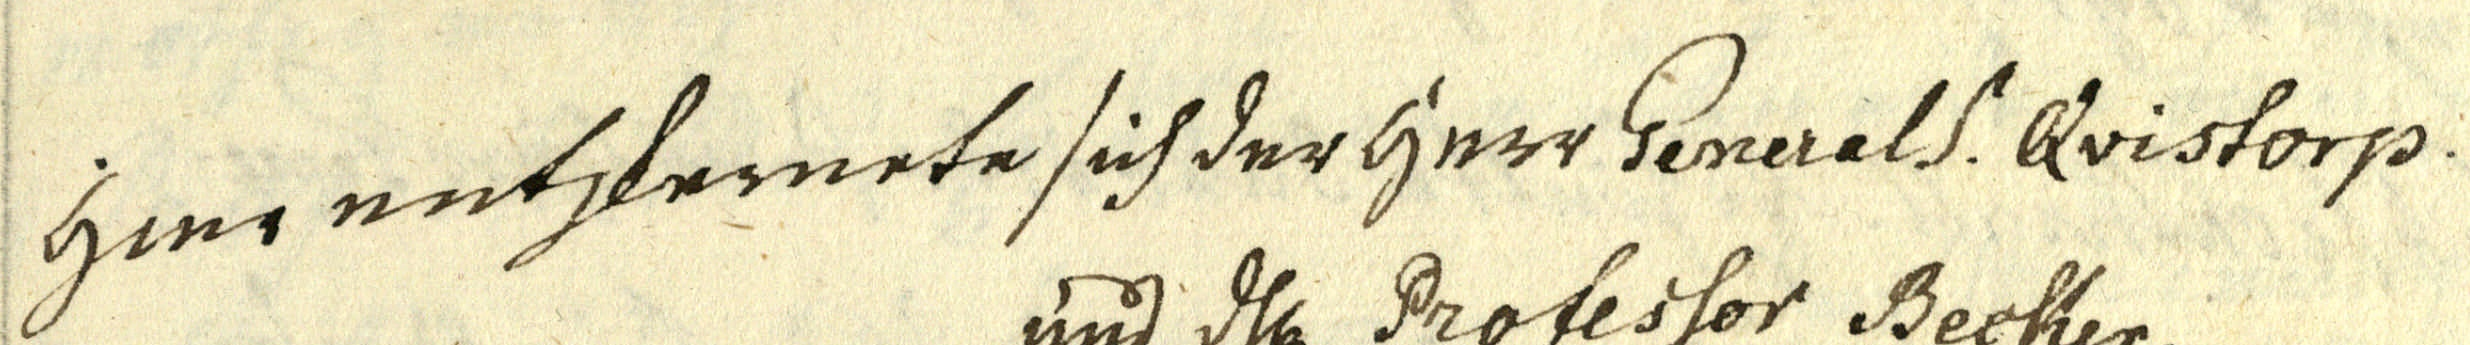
Hier entfernete sich der Herr GeneralS. Quistorp
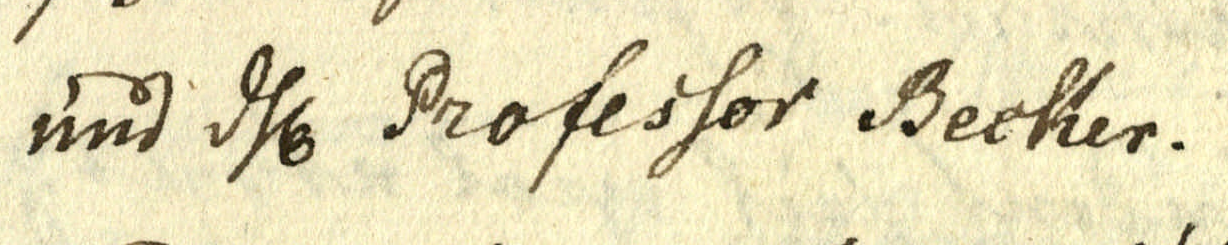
und dh Professor Becker.
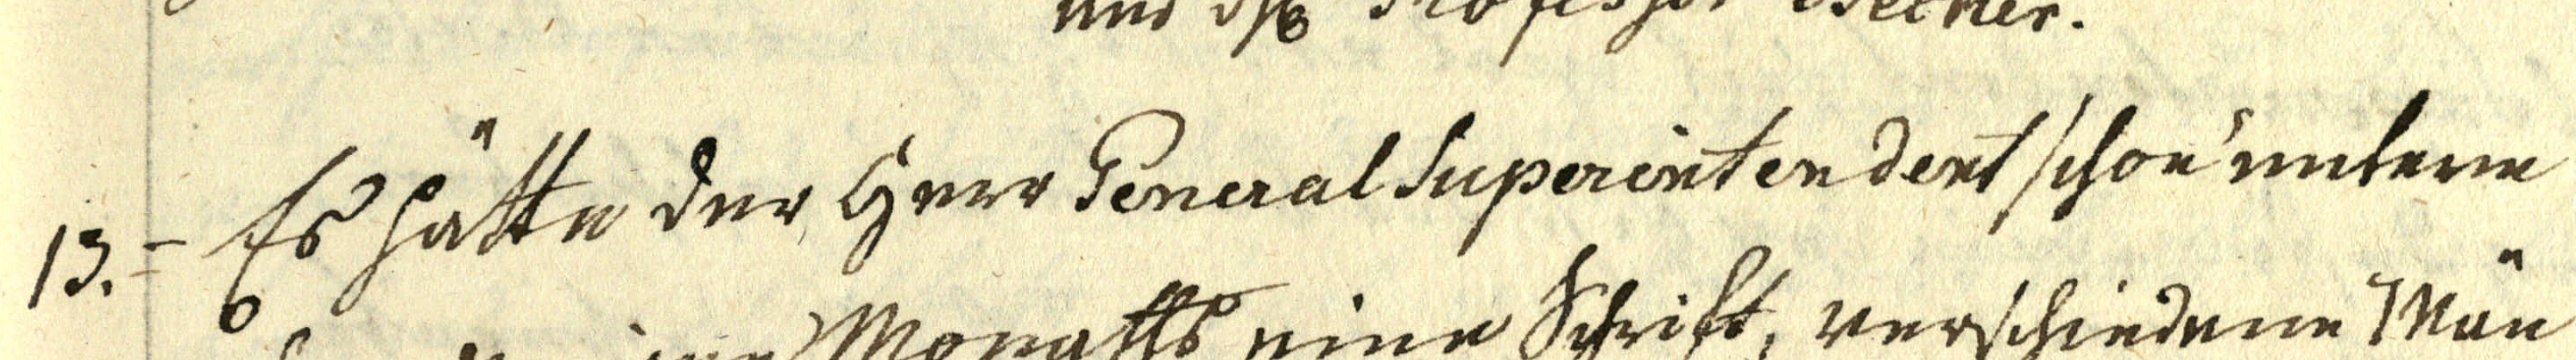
13. Es hätte der Herr GeneralSuperintendent schon unterm
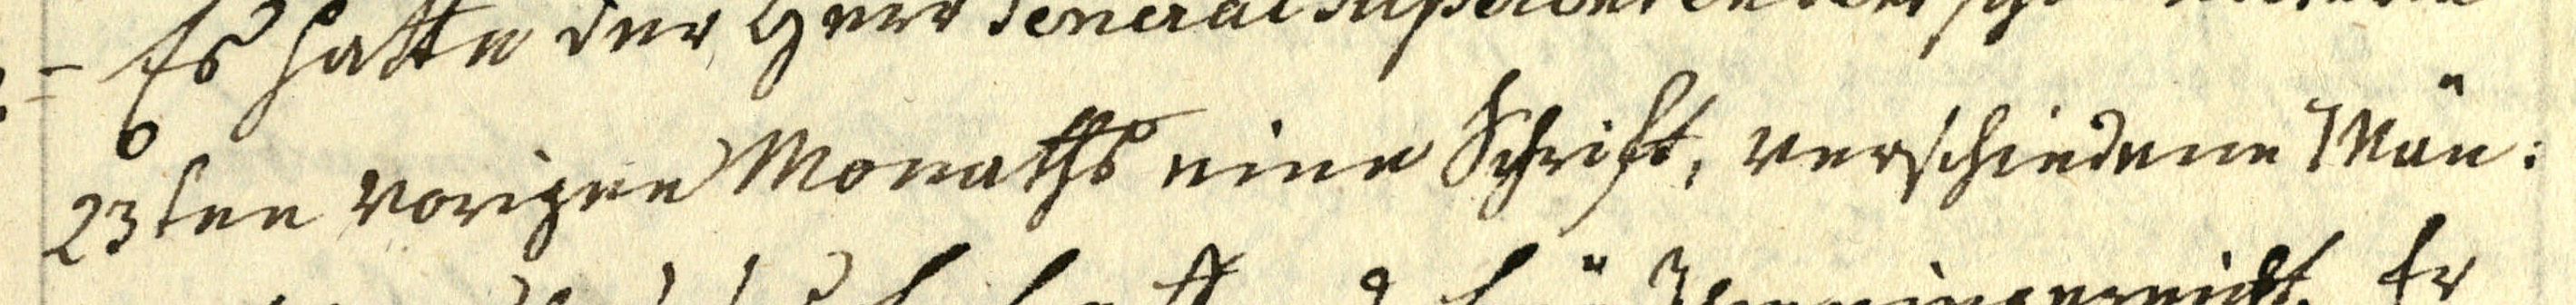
23 ten vorigen Monaths eine Schrift, verschiedene Män¬
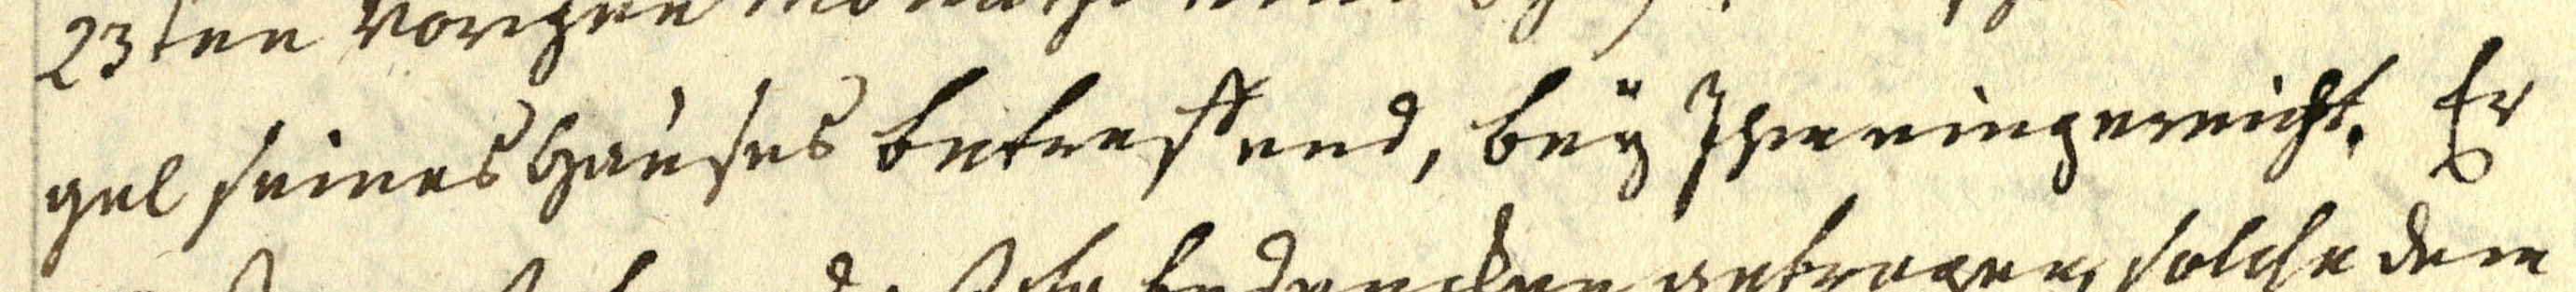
gel seines Hauses betreffend, beÿ Ihm eingereicht, Er
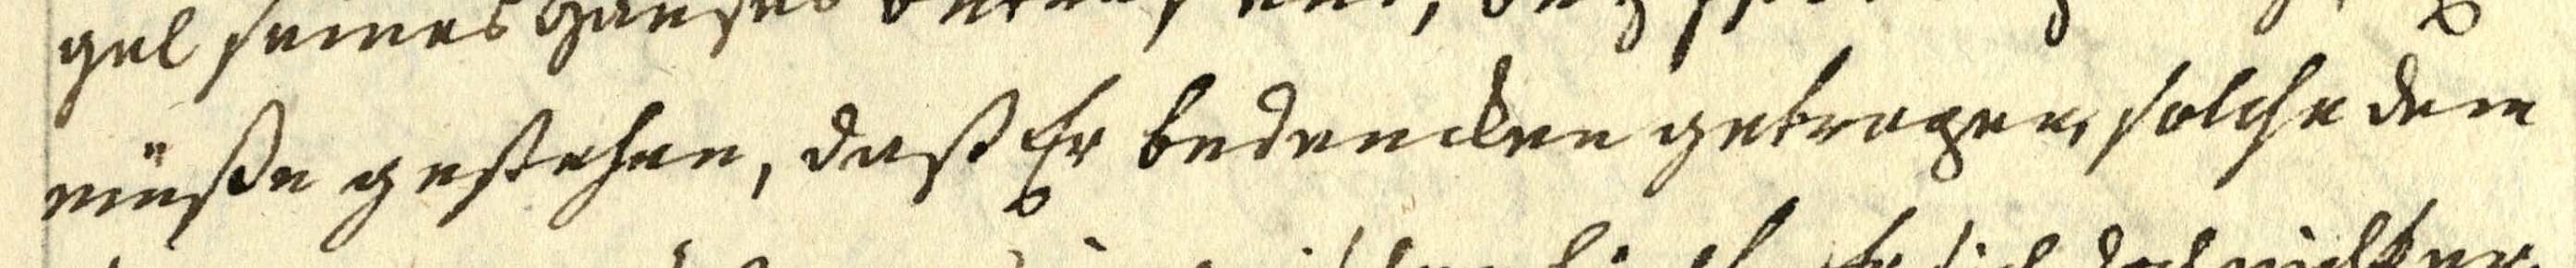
müße gestehen, daß Er Bedencken getragen, solche dem
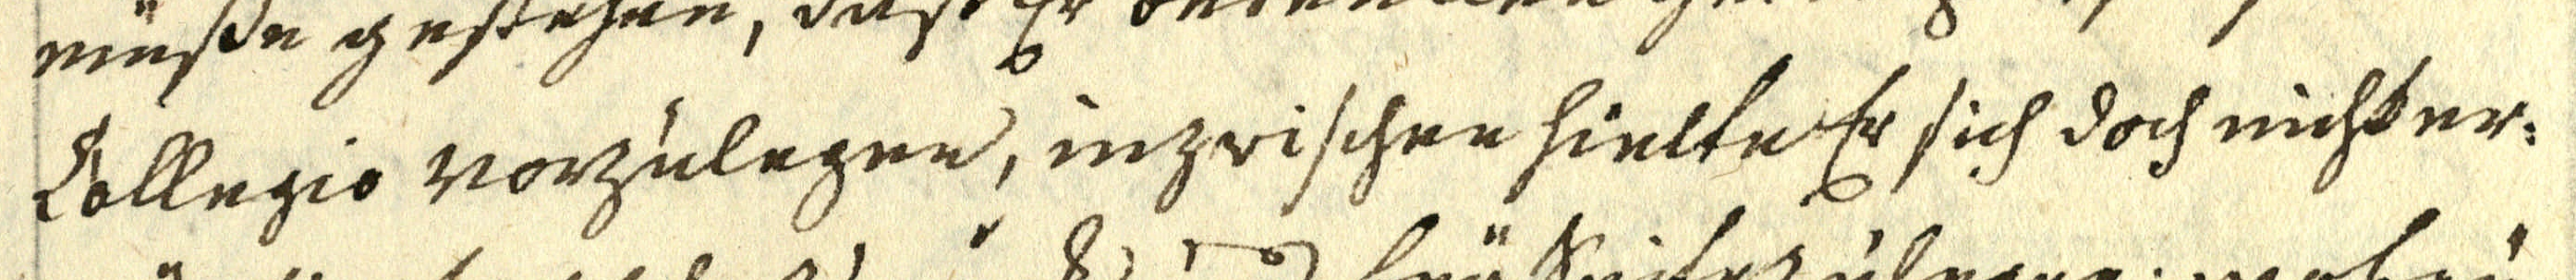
Collegio vorzulegen, inzwischen hielte Er sich doch nicht er¬
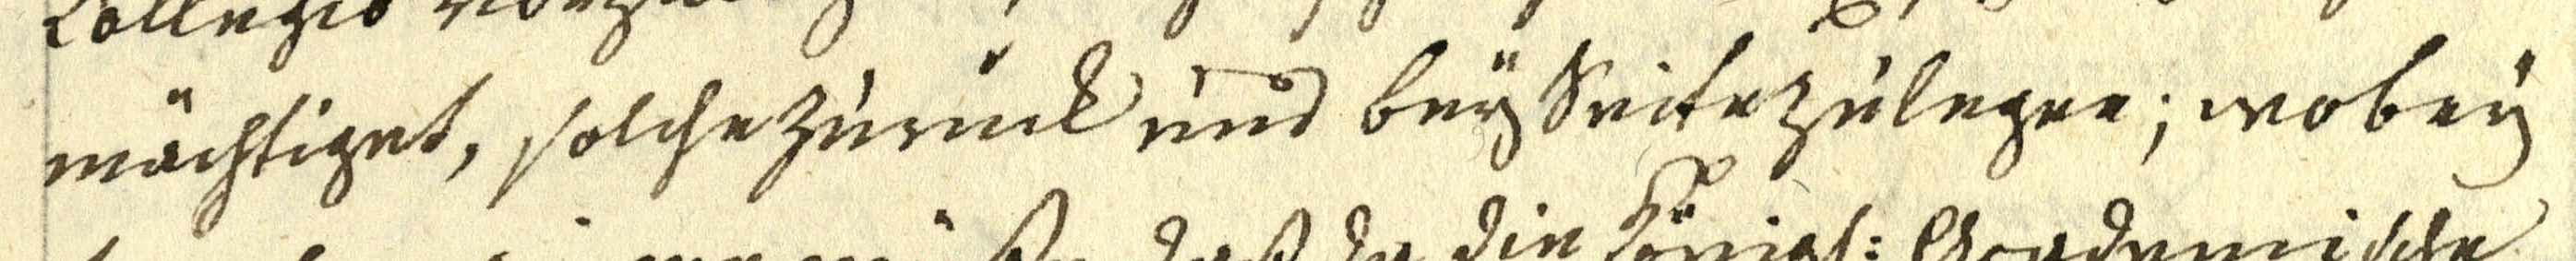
mächtiget, solche zurück und beÿ Seite zulegen; wobeÿ
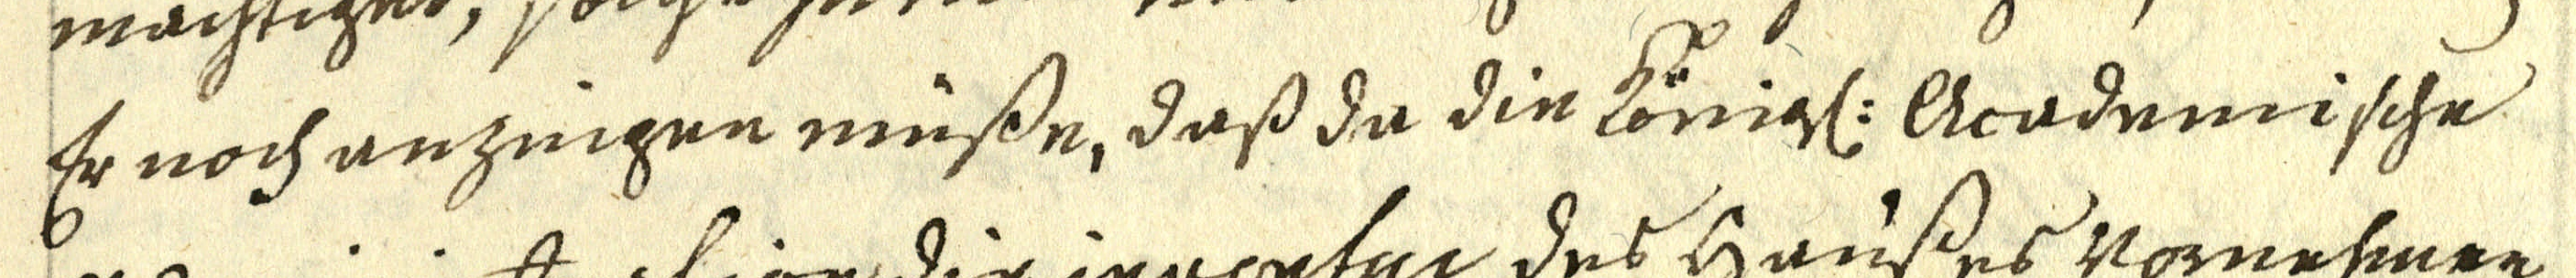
Er noch anzeigen müße, daß da die Königl. Academische
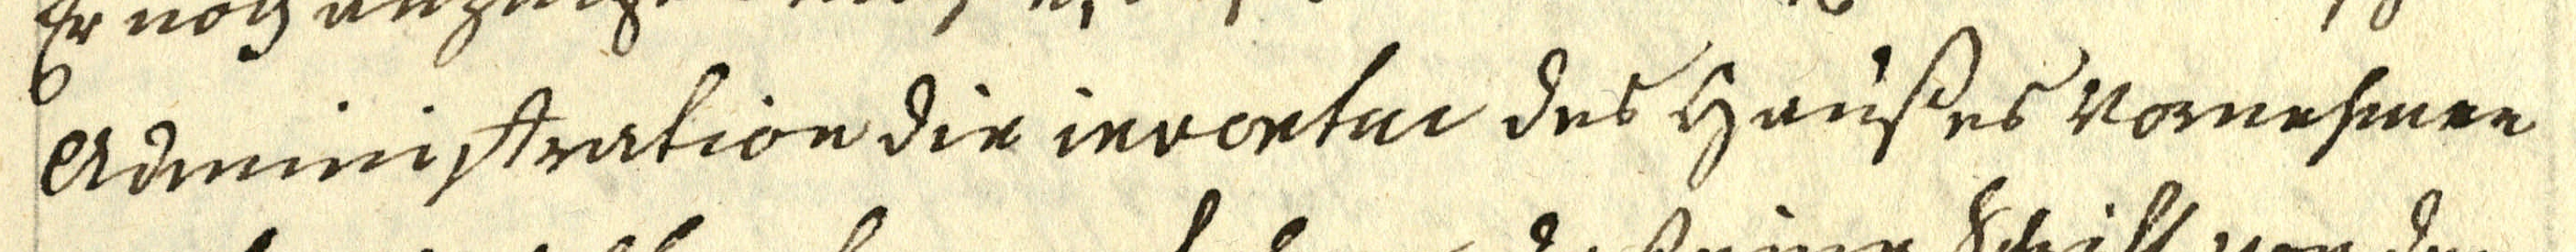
Administration die inventur des Haußes vornehmen
